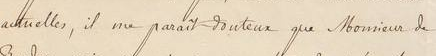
actuelles, il me paraît douteux que Monsieur de
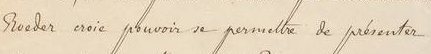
Roeder croie pouvoir se permettre de présenter
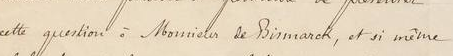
cette question à Monsieur de Bismarck, et si même
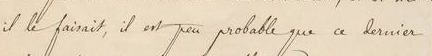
il le faisait, il est peu probable que ce dernier
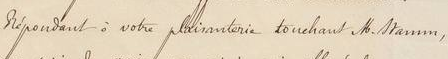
Répondant à votre plaisanterie touchant M. Stamm,
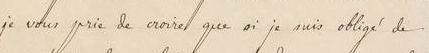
je vous prie de croire que si je suis obligé de
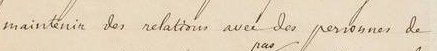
maintenir des relations avec des personnes de
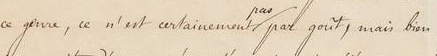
ce genre, ce n´est certainement pas par goût, mais bien
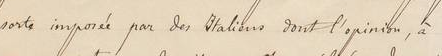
sorte imposée par des Italiens dont l´opinion, à
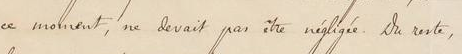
ce moment, ne devait pas être négligée. Du reste,
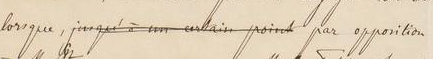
lorsque, jusqu´à un certain point par opposition
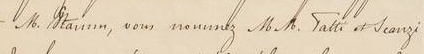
M. Stamm, vous nommez M.M. Tatti et Scanzi
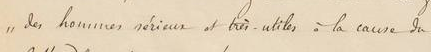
«des hommes sérieux et très-utiles à la cause du
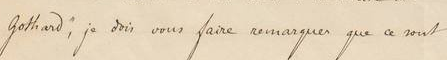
Gothard», je dois vous faire remarquer que ce sont
